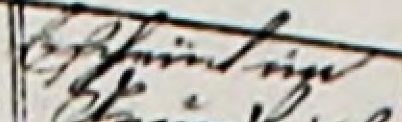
Esseint im
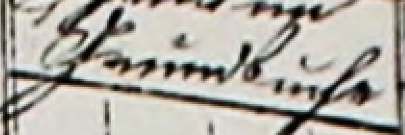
Grundbuche
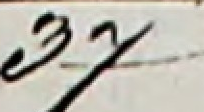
37
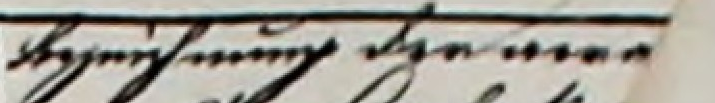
Bezeichnung der erarischen
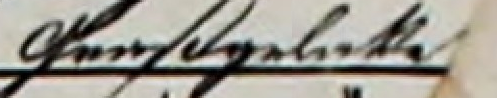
Graßgelake
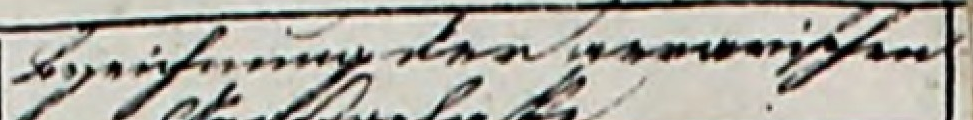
Bezeichnung der erarischen
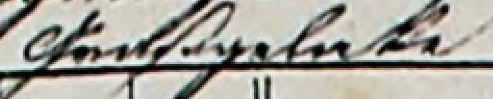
Graßgelake
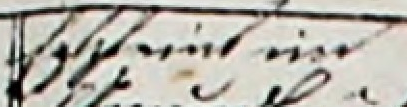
Esseint im
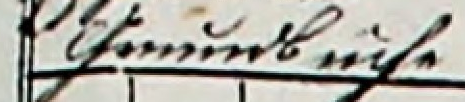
Grundbuche
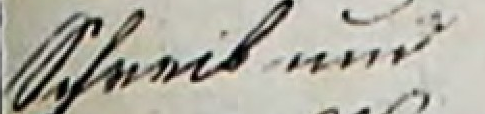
Schreib und
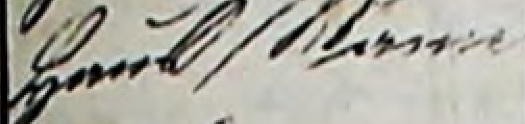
Haus Name
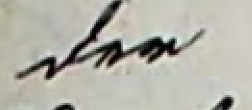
der
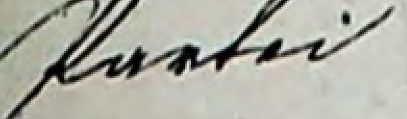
Partei.
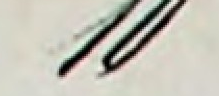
10
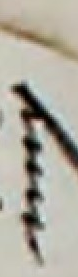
ung
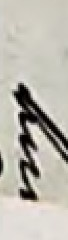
ung
